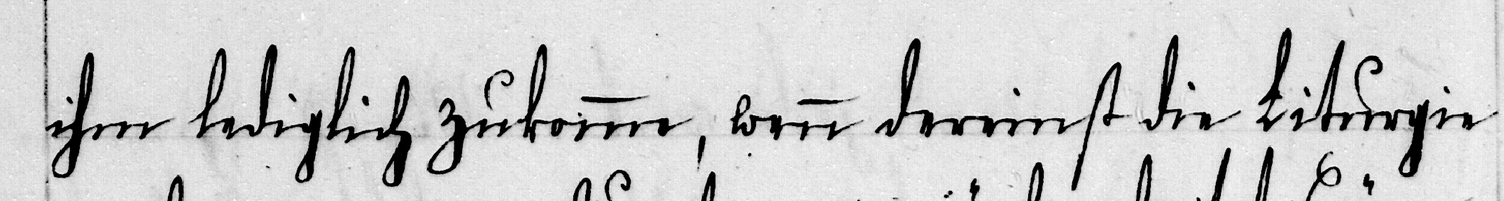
ihm lediglich zukomme, wenn dereinst die Liturgie
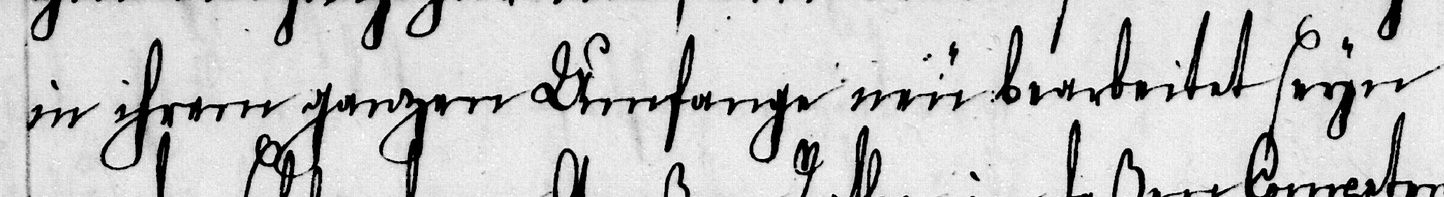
in ihrem ganzen Umfange neu bearbeitet seyn
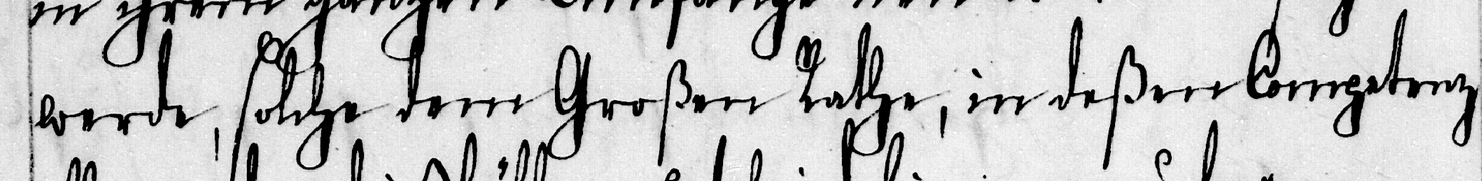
werde, solche dem Großen Rathe, in deßen Competenz
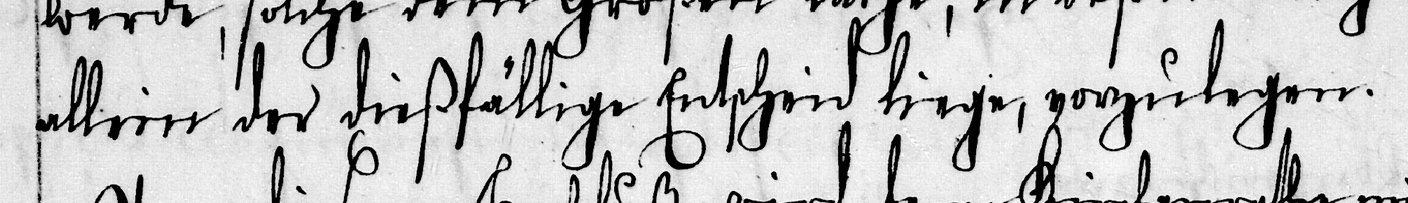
allein der dießfällige Entscheid liege, vorzulegen.
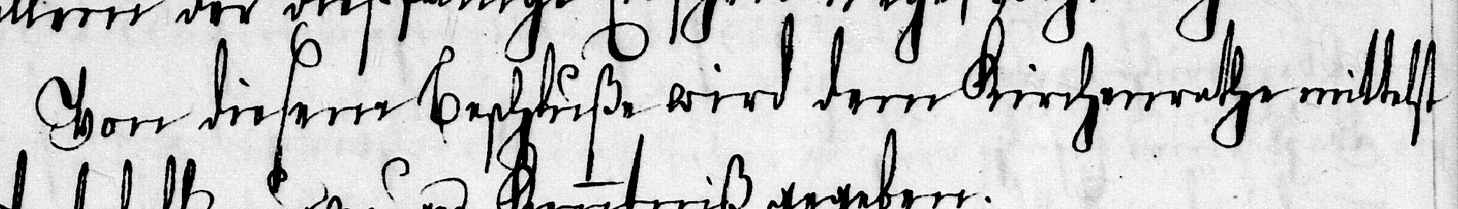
Von diesem Beschluße wird dem Kirchenrathe mittel¬
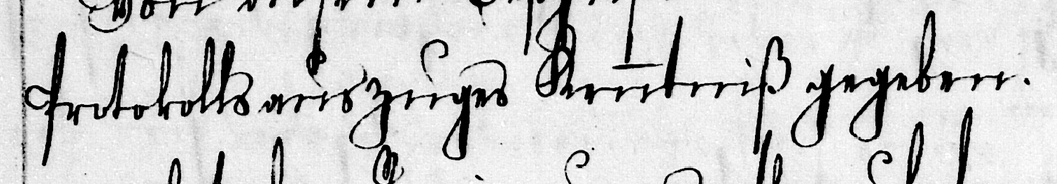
Protokollsauszuges Kenntniß gegeben.
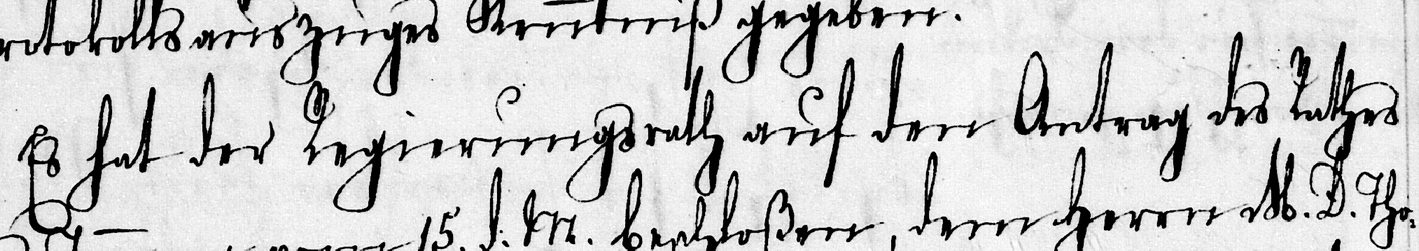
Es hat der Regierungsrath auf den Antrag des Rathes
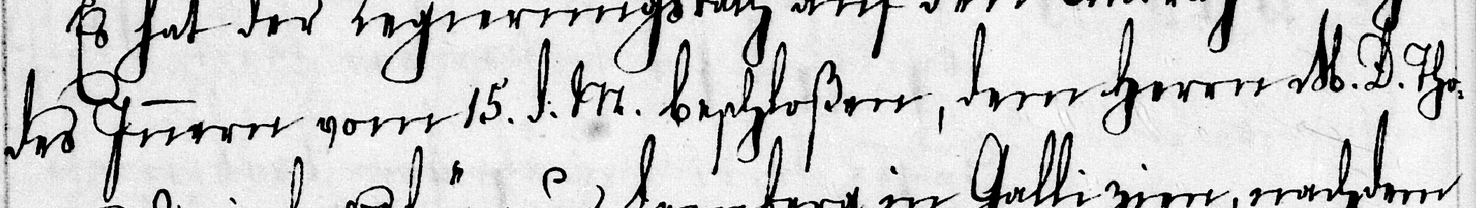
des Innern vom 15. d. M. beschloßen, dem Herrn M. D. Th¬
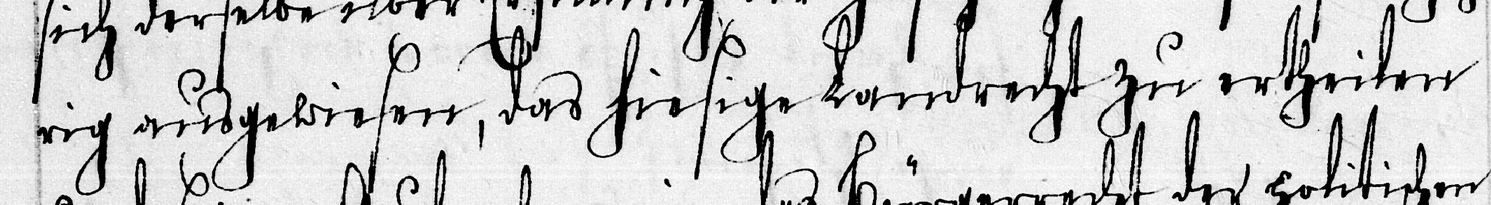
ig ausgewiesen, das hiesige Landrecht zu ertheilen
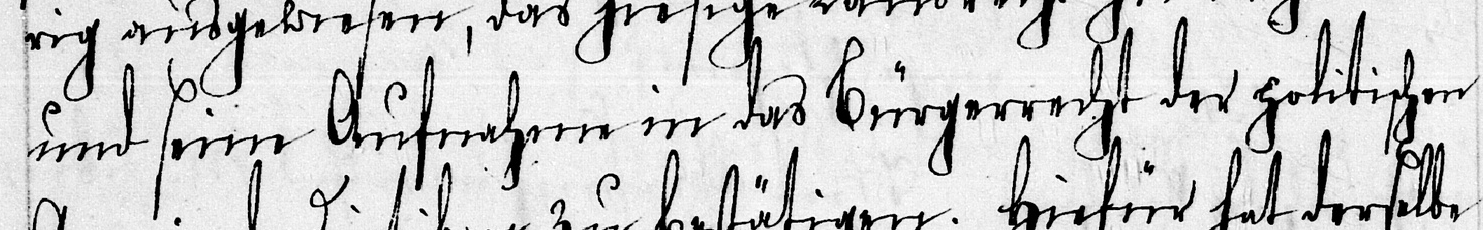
und seine Aufnahme in das Bürgerrecht der politisch¬
